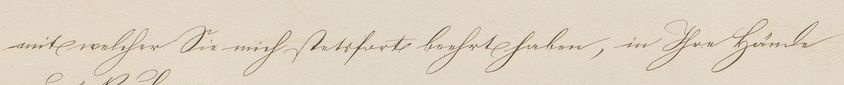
mit welcher Sie mich stetsfort beehrt haben, in Ihre Hände
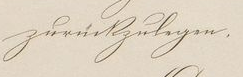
zurückzulegen.
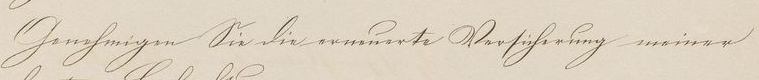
Genehmigen Sie die erneuerte Versicherung meiner
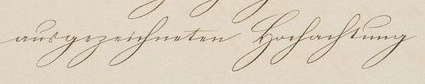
ausgezeichneten Hochachtung
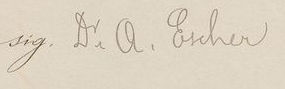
sig. Dr A. Escher
